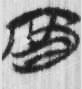晨
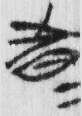之日
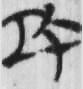攻
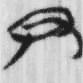尹
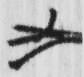之
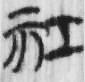{示工}（攻）
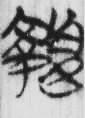執
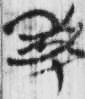事
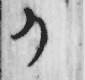人
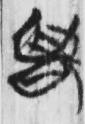○（夏）
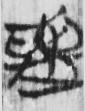○（舉）
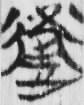衛
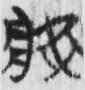妝
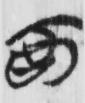爲
